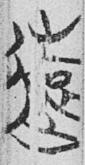遠
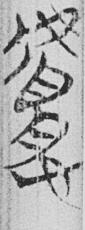○（慮）
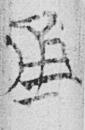甬（用）
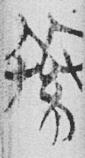素
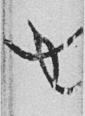心
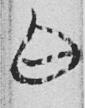白
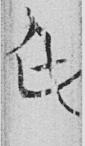身
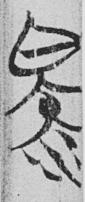澤（釋）
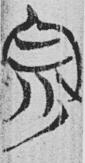○（余）
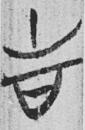告
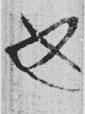女（汝）
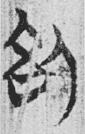咎
